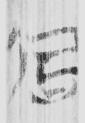{人己口}
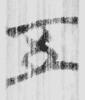五
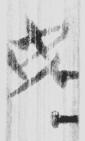𡚦
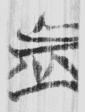者
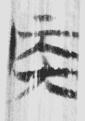候
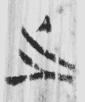之
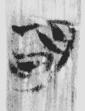明
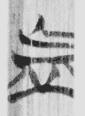者
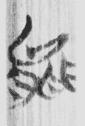能
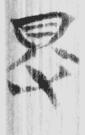𠭁
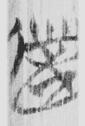{人菐臣}
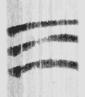三
